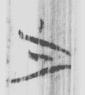之
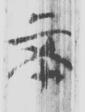不
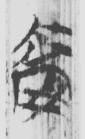爾
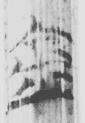金
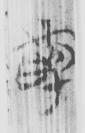革
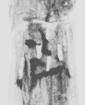之
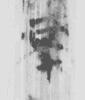不
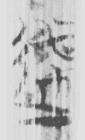{辶㡀}
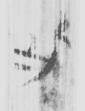此
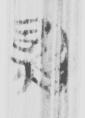則
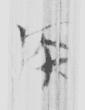侯
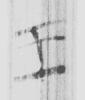王
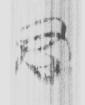君
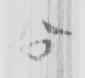公
